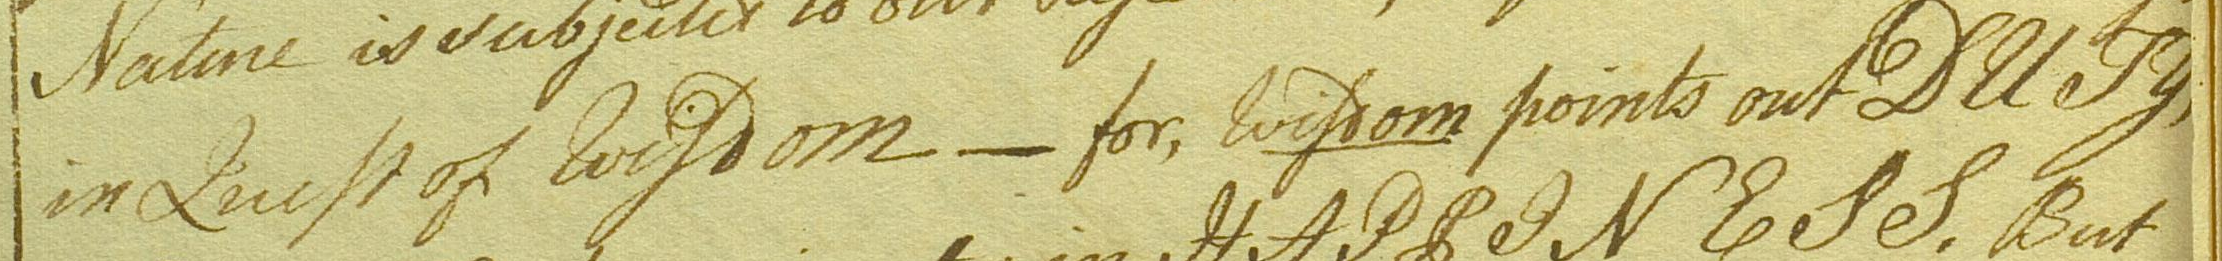in Quest of Wisdom – for, Wisdom points out DUTY,
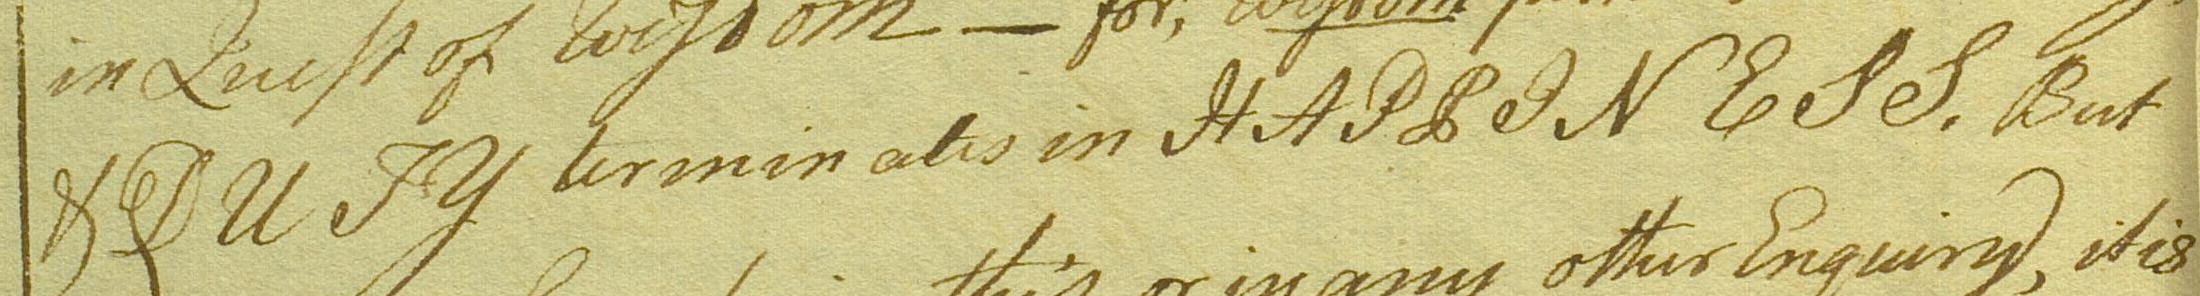& DUTY terminates in HAPPINESS. But
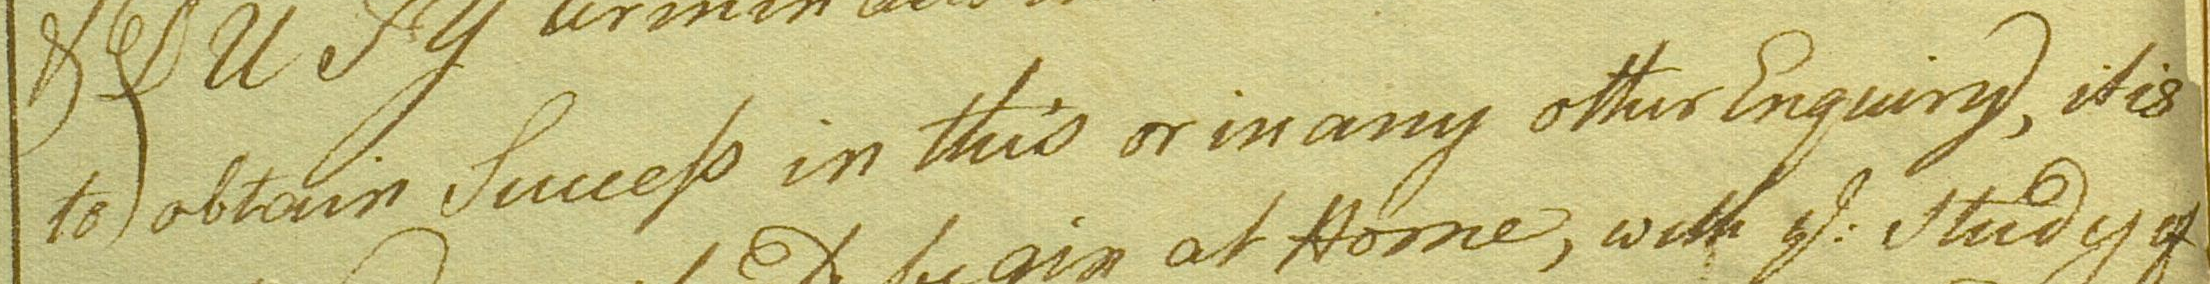to obtain Success in this or in any other Enquiry, it is
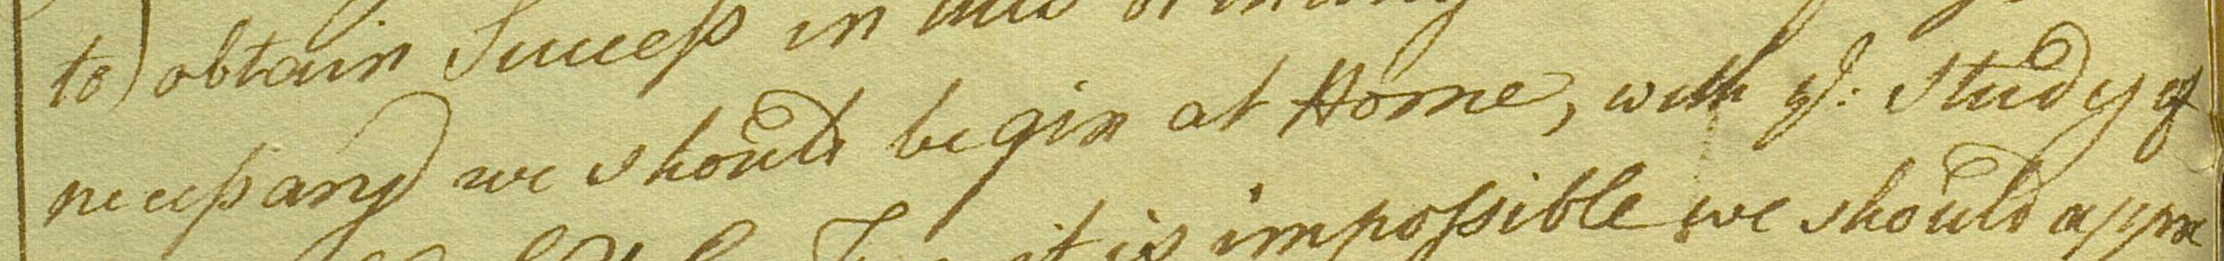necessary we should begin at Home, with y^e: study of
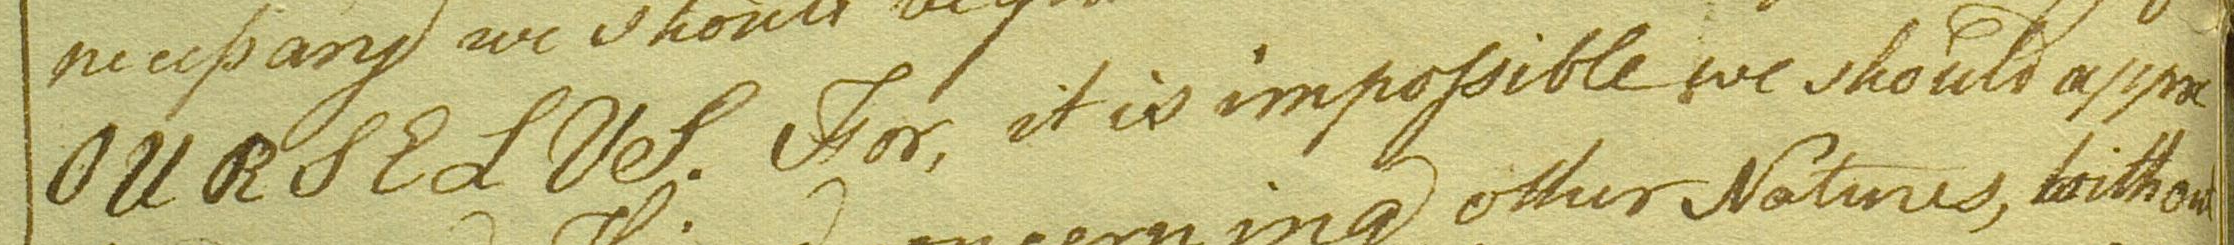OURSELVES. For, it is impossible we should appre
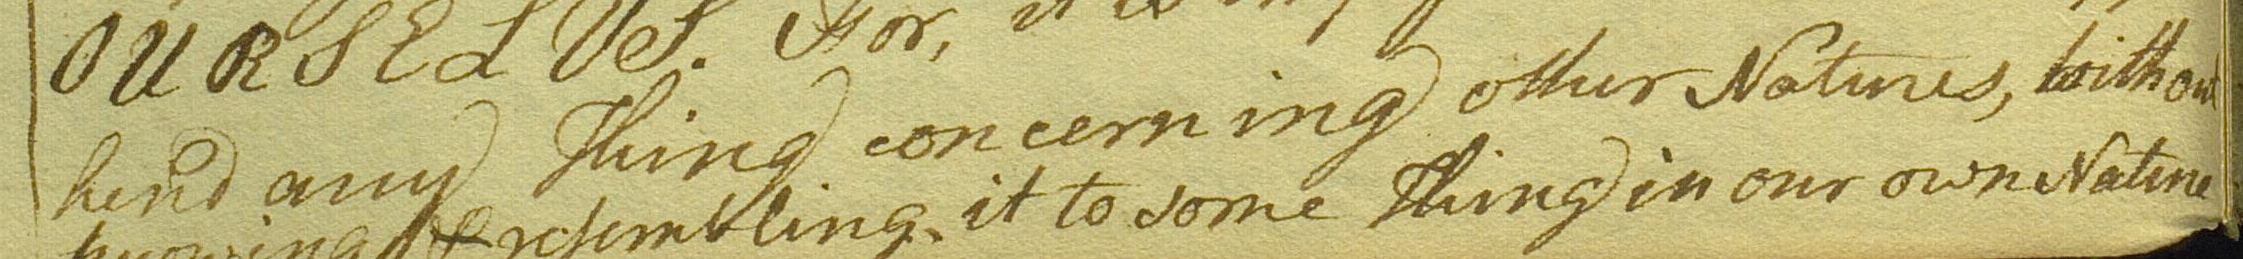hend any Thing concerning other Natures, without
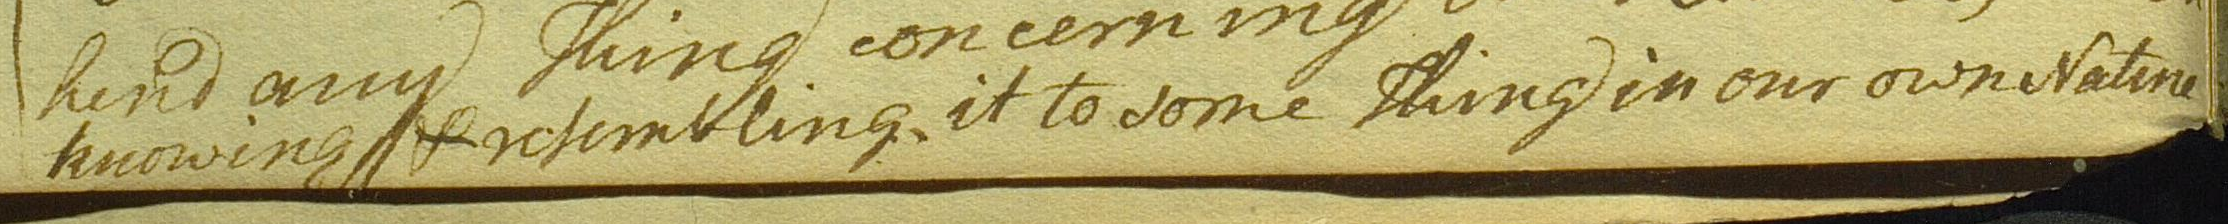knowing & resembling it to some thing in our own Nature
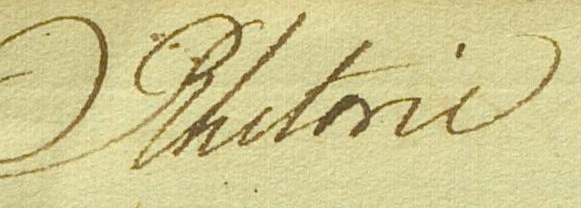Rhetoric
